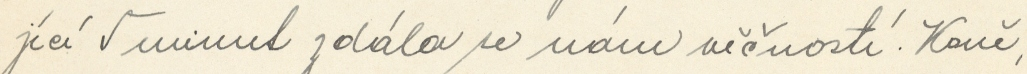jící 5 minut zdála se nám věčností. Koně,
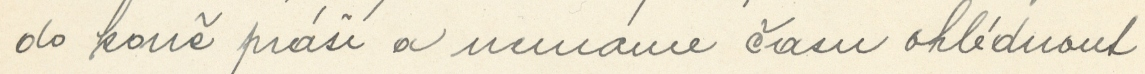do koně práší a nemáme času ohlédnout
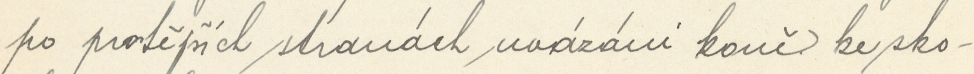po protějších stranách uvázáni koně ke sko-
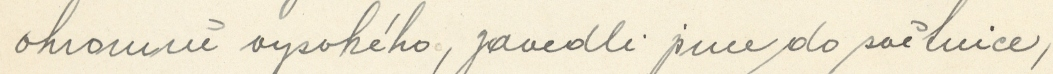ohromně vysokého, zavedli jsme do světnice,
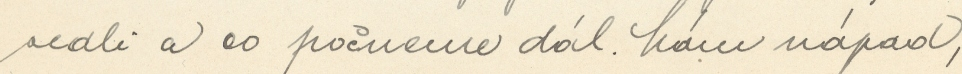vedli a co počneme dál. Mám nápad,
